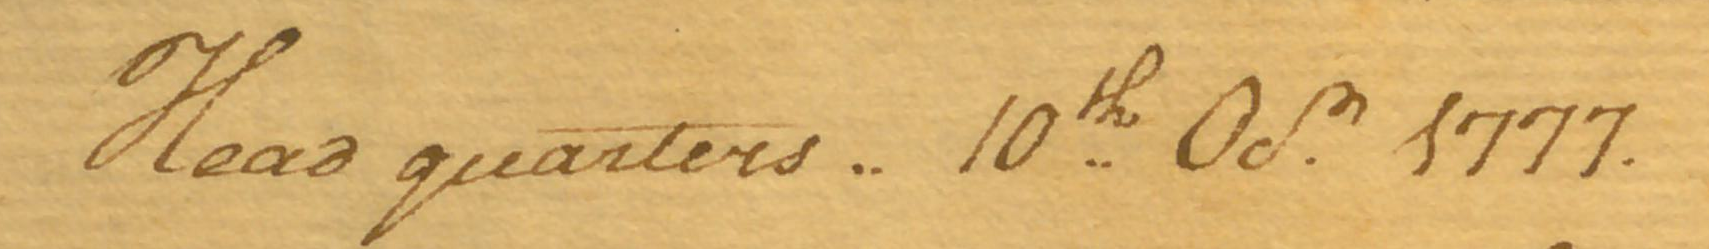Head quarters. 10^th. Oc^r. 1777.
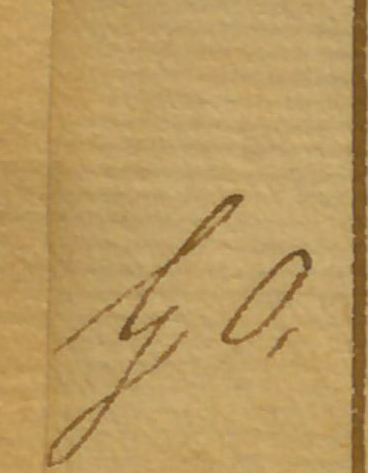G.O.
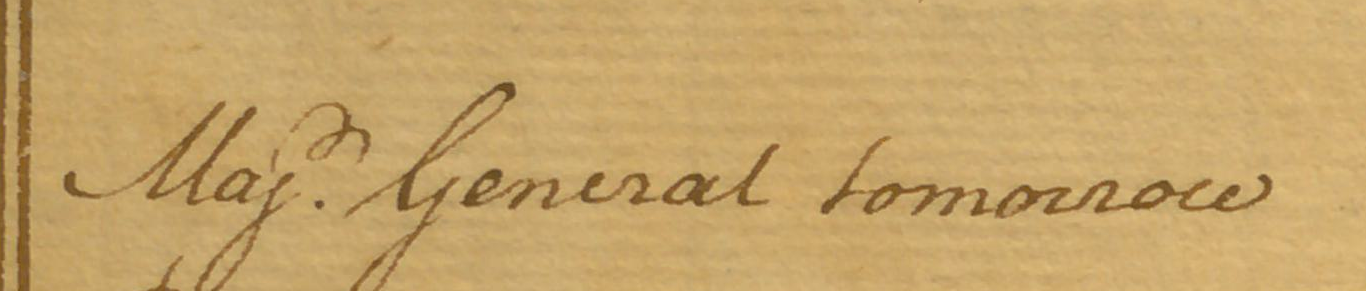Maj^r. General tomorrow
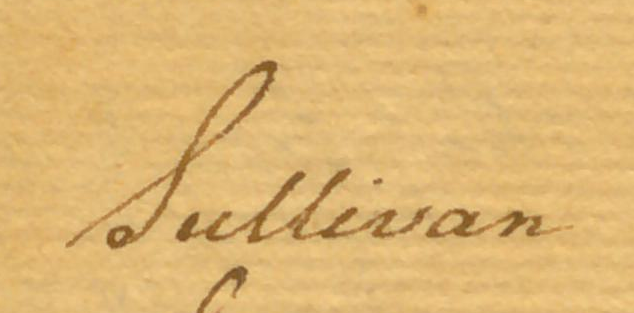Sullivan
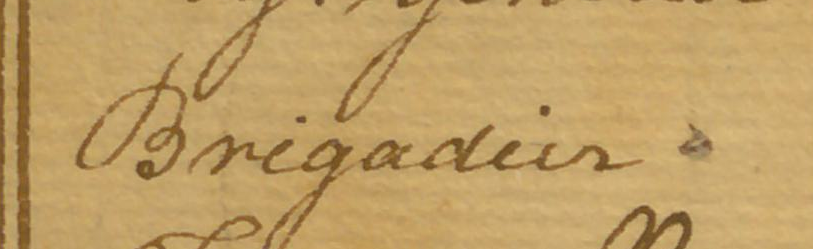Brigadier
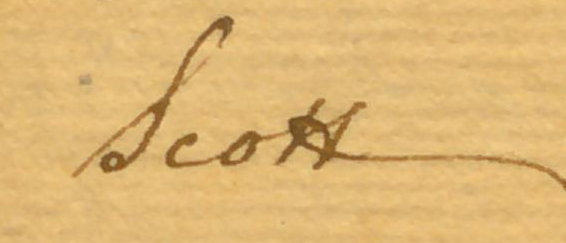Scott
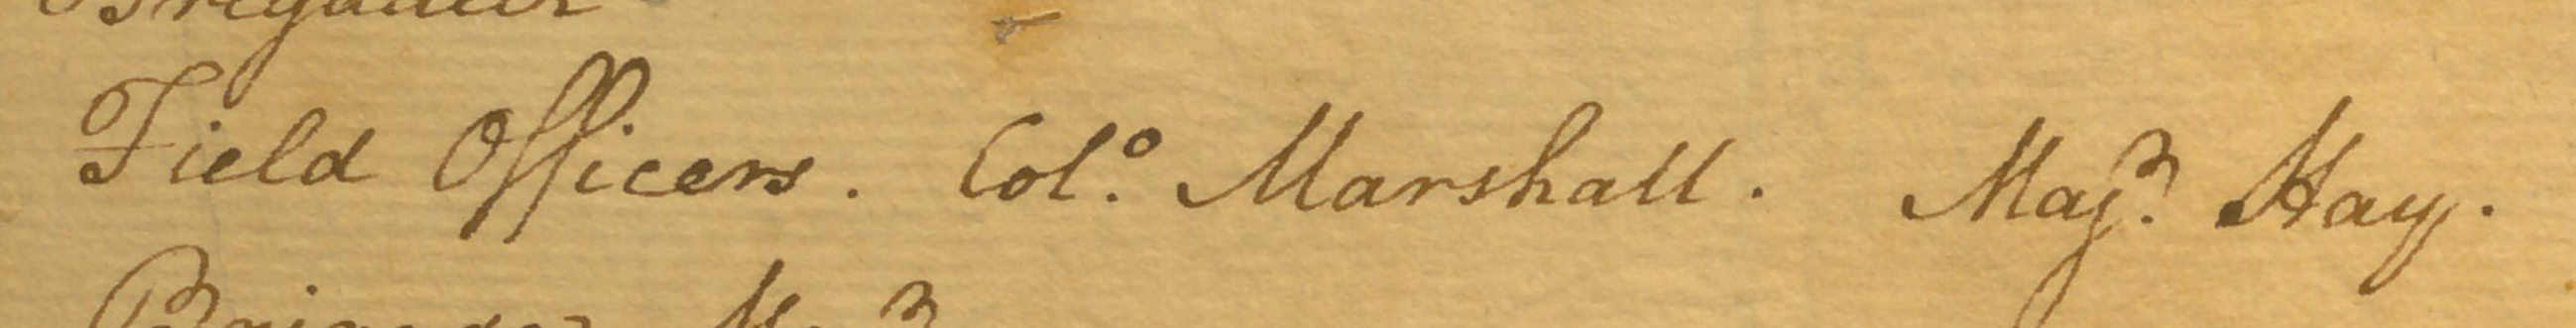Field Officers. Col^o. Marshall. Maj^r. Hay.
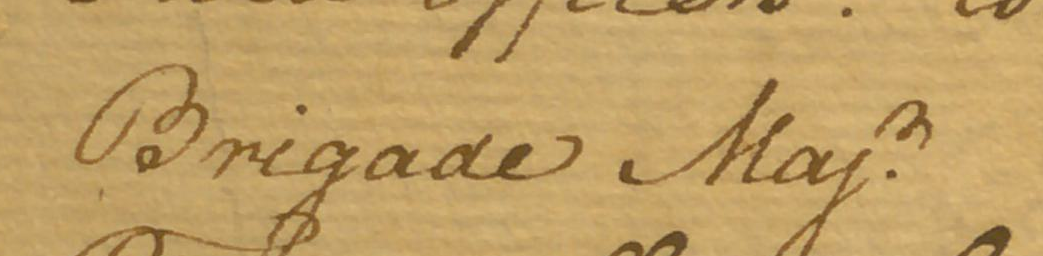Brigade Maj^r.
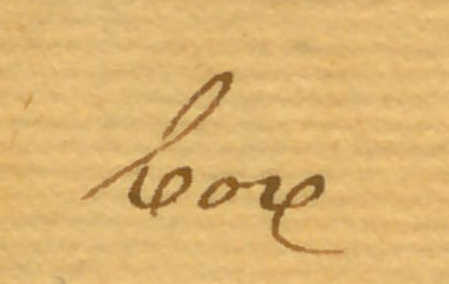Cox
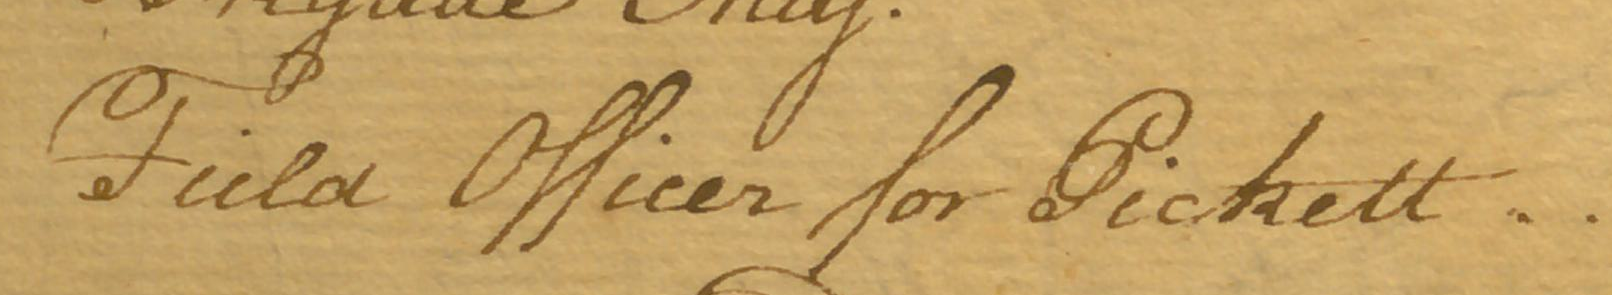Field Officer for Pickett
